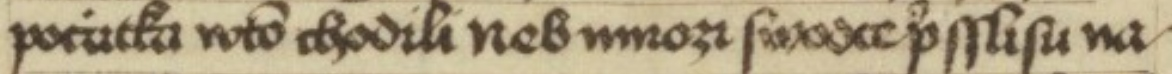poċatka wtȏ chodili neb mnozi ſwodce p̄ſſliſu na
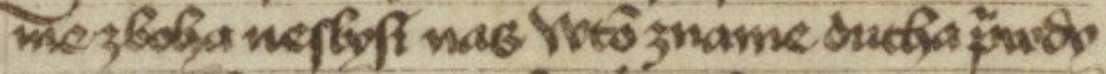me zboha neſlyẛi nas Wtȏ zname ducha p̃wdy
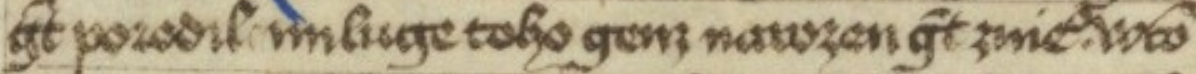g̑t porodil miluge toho genz narozen g̑t znie° Wtȏ
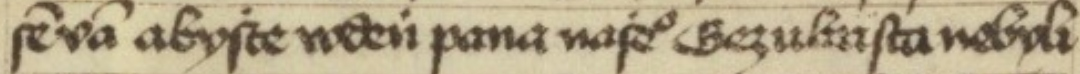ſȇ vȃ abyẛte wdeṅ pana naẛe° Gezukriſta nebyli
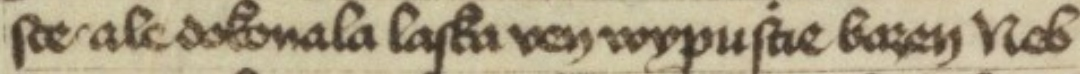ſce ale dokonala laſka ven wypuẛtie bazen Neb
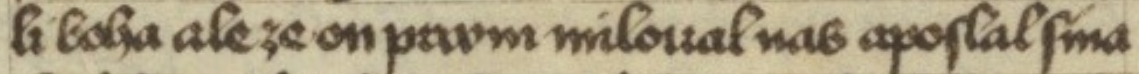li boha ale ze on prwni miloual nas apoſlal ſina
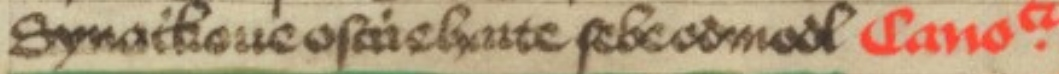Synaċkoue oſtṙiehaite ſebe odmodl Cano.ca
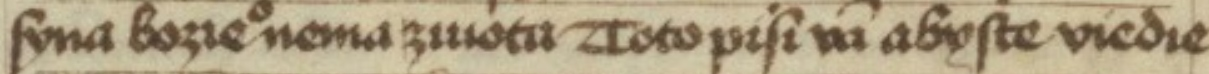ſyna bozie° nema ziuota Toto piẛi vȃ abyẛte viedie-
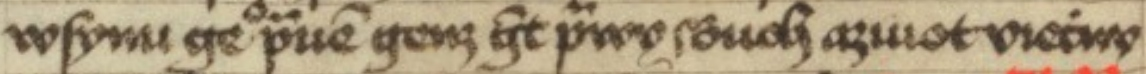wſynu ge° p̃uȇ genz g̑t p̃wy Buch aziuot vieċny
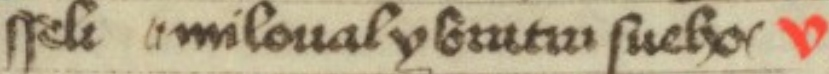ſſeli miloual y bratra ſueho V
